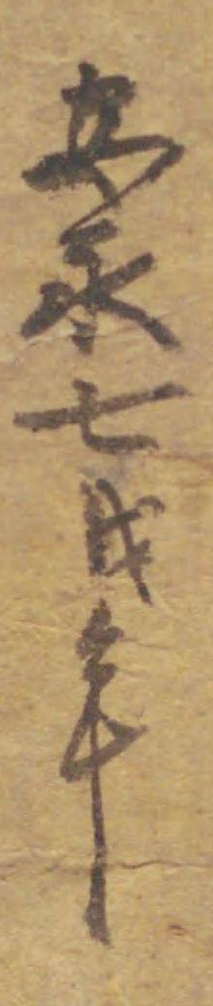安永七戌年
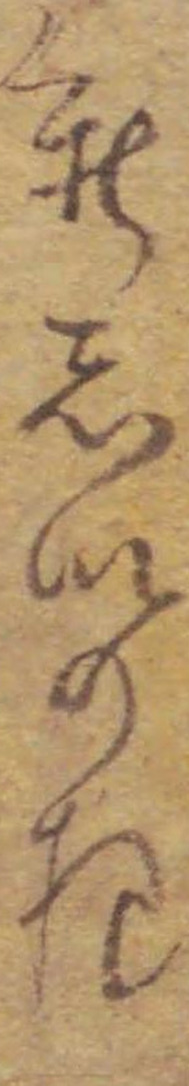新しいの根

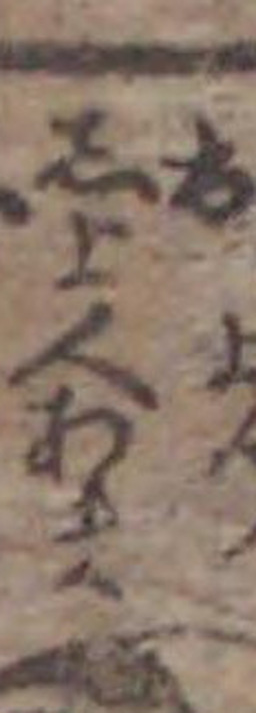しよ人あま
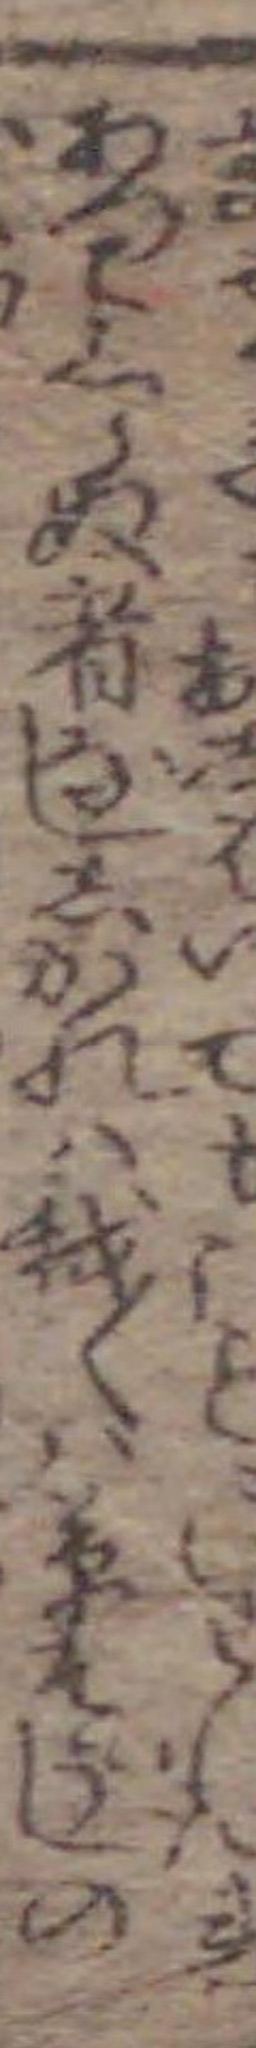あつてしらぬ者なししかれは我〳〵は草そうしの
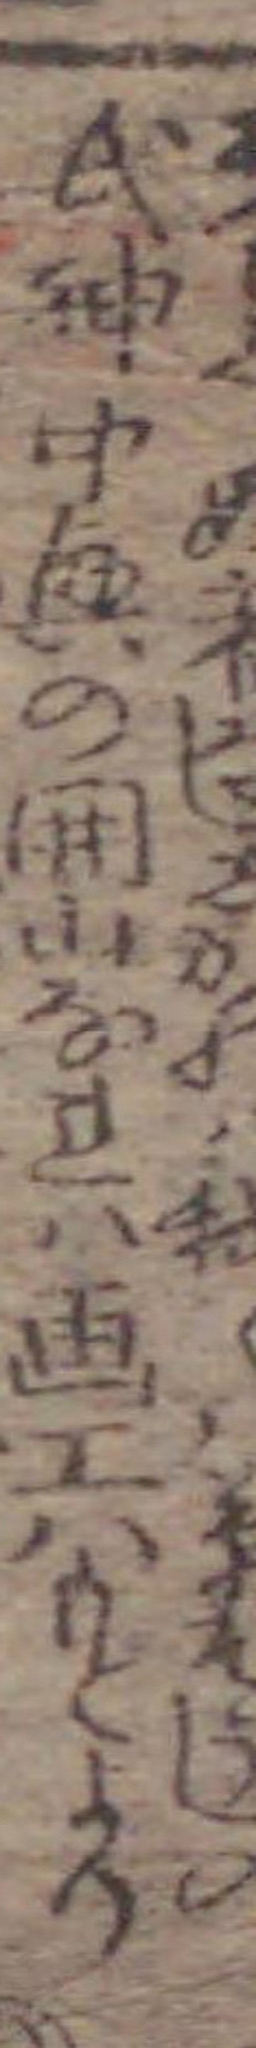氏神中興の開山なれは画工はもとより
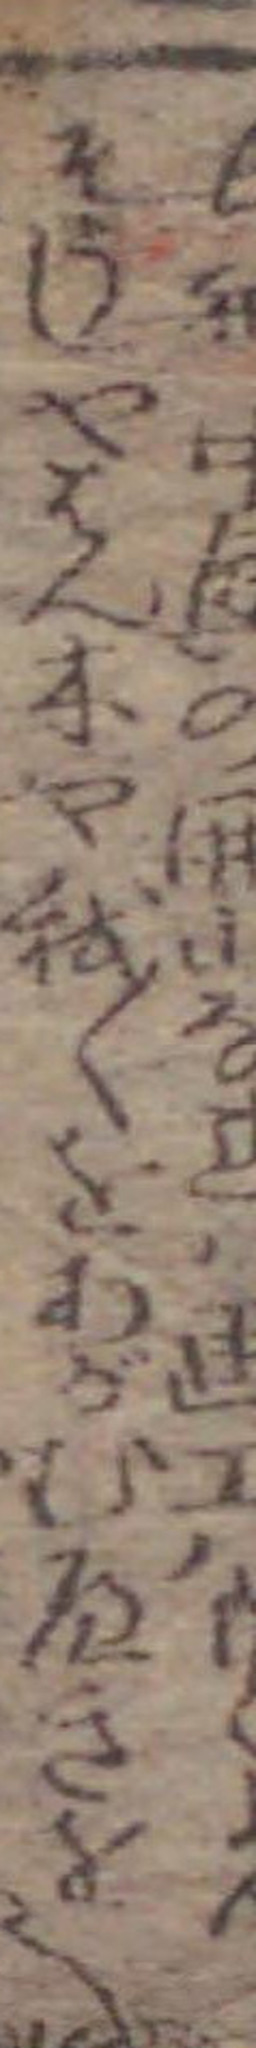そうしやはん木や我〳〵をあがむへきを
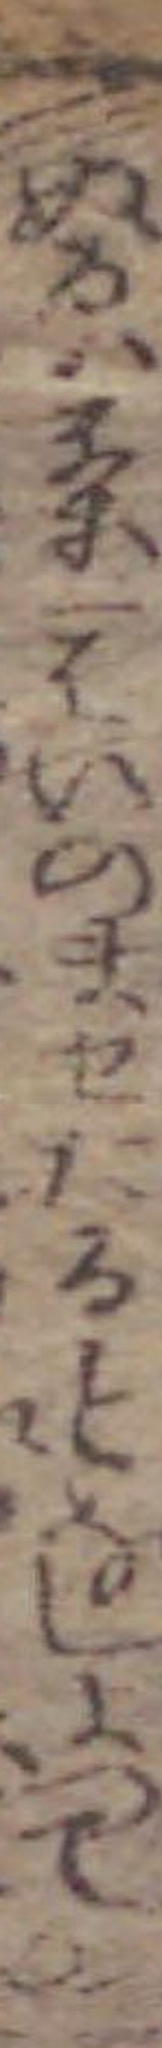ぬるい茶一はいのませたることなしよつて
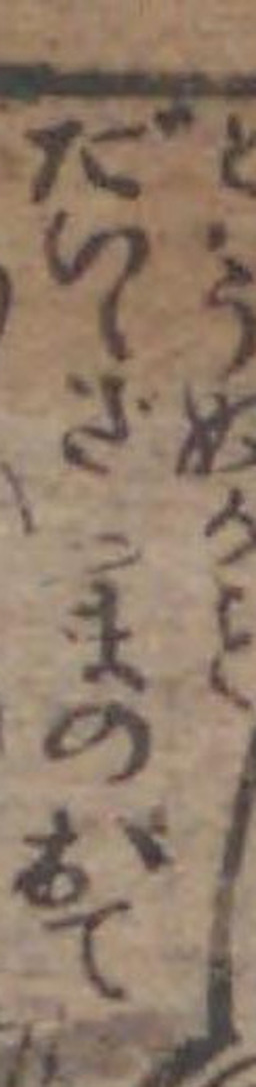だいゝざまのおて
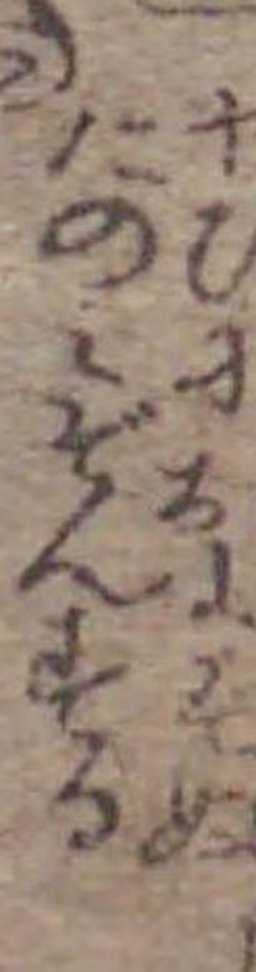たのみぞんする
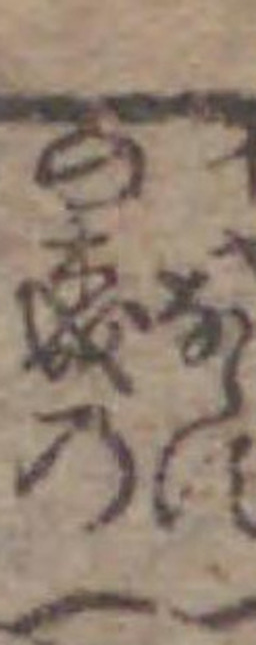の森の
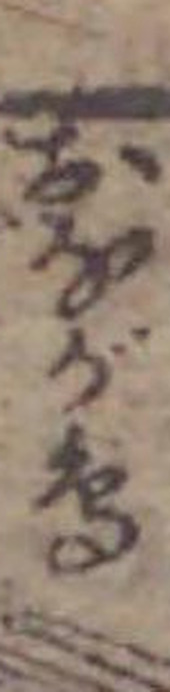おなが鳥
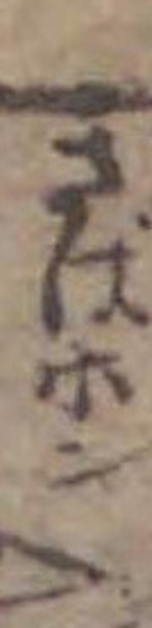さばホン
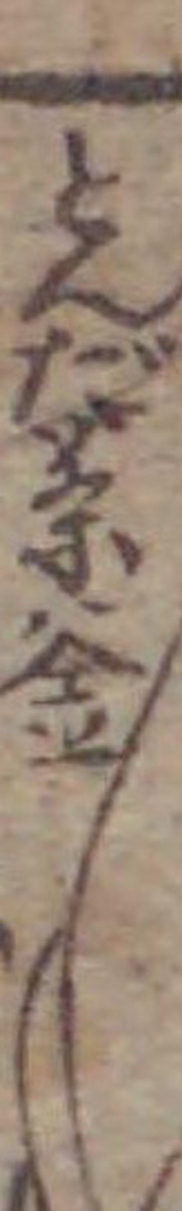とんだ茶釜
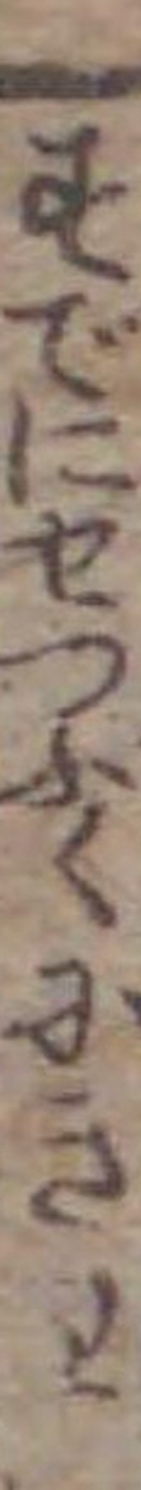すでにせつふくにきわ
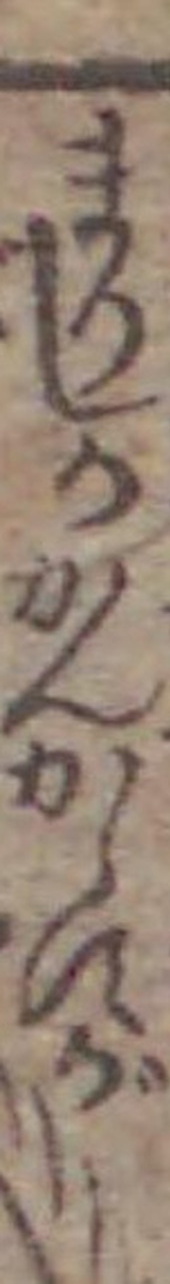まりしかかんからすが
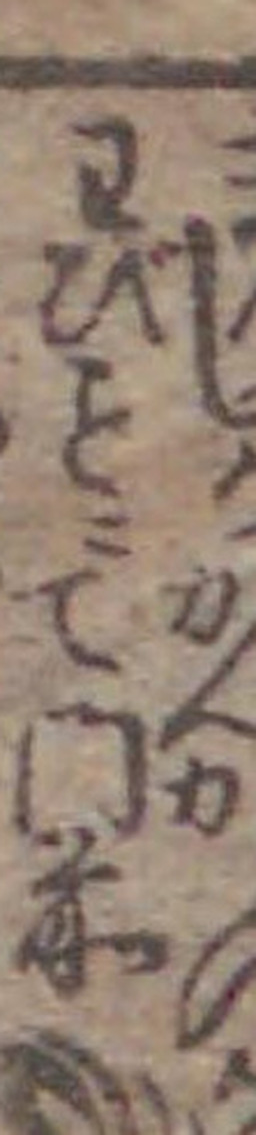わびことにて門前
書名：辞闘戦新根 （国会）
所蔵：国立国会図書館 National Diet Library, JAPAN
